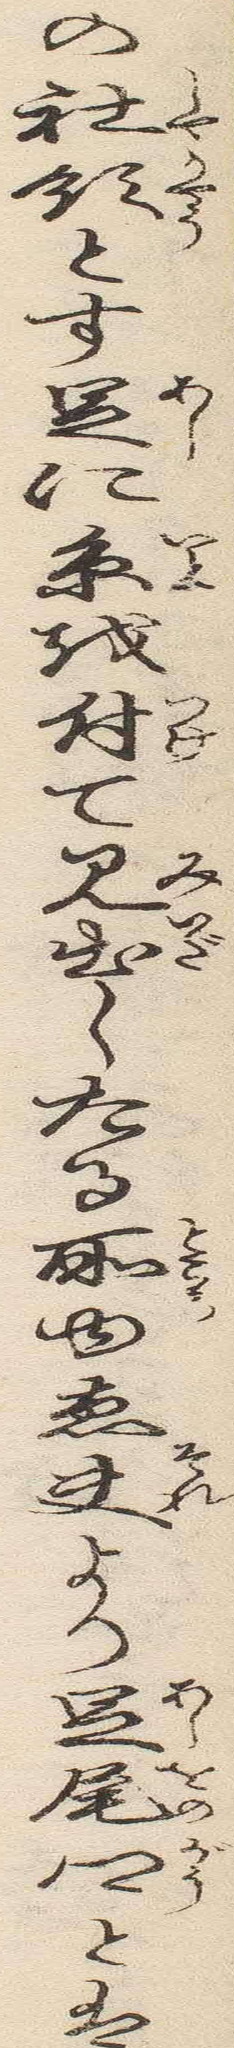の社領とす足に糸を付て見出したる所ゆゑ夫より足尾郷とは
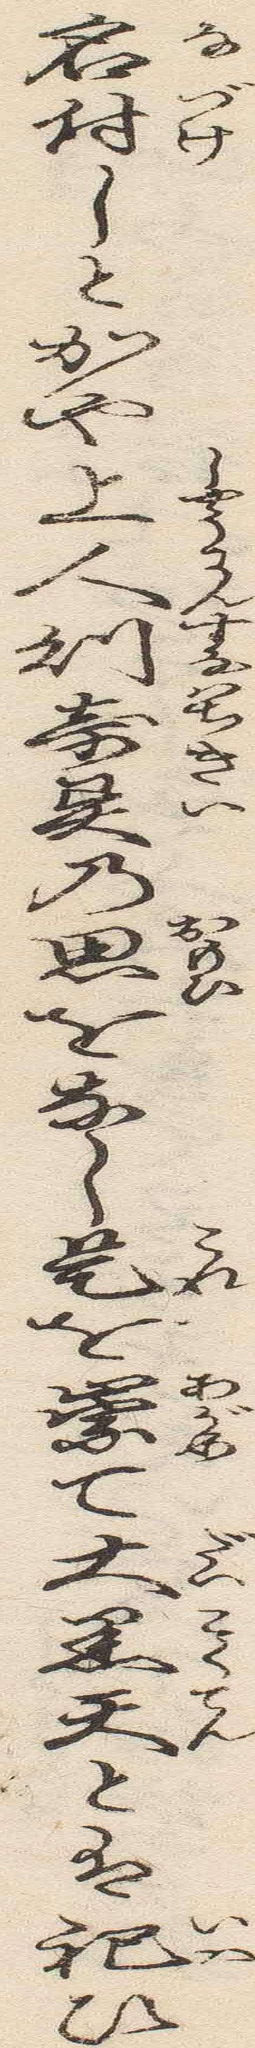名附しとかや上人則奇異の思をなし是を崇て大黒天とは祀ひ
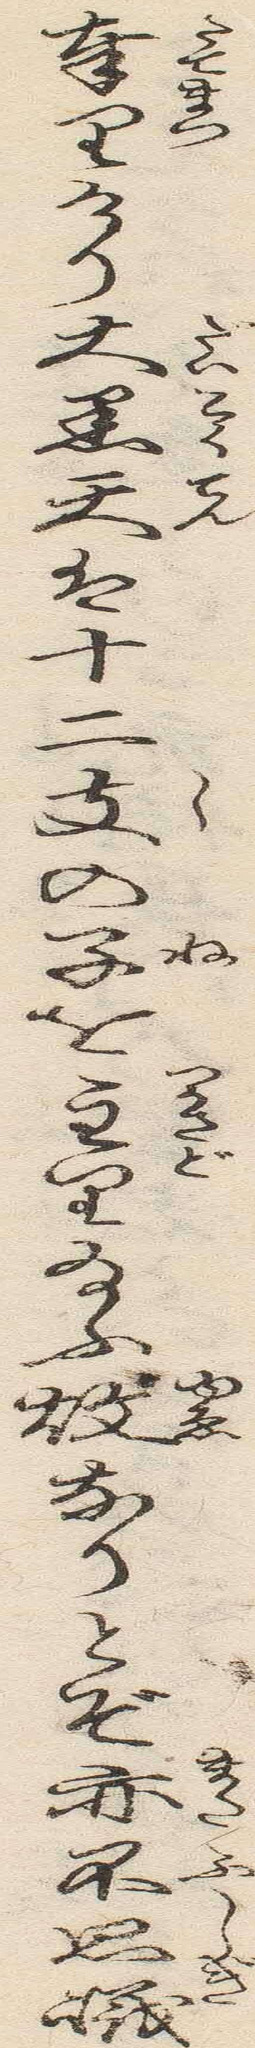奉りけり大黒天は十二支の子を主り給ふ故なりとぞ亦不思議
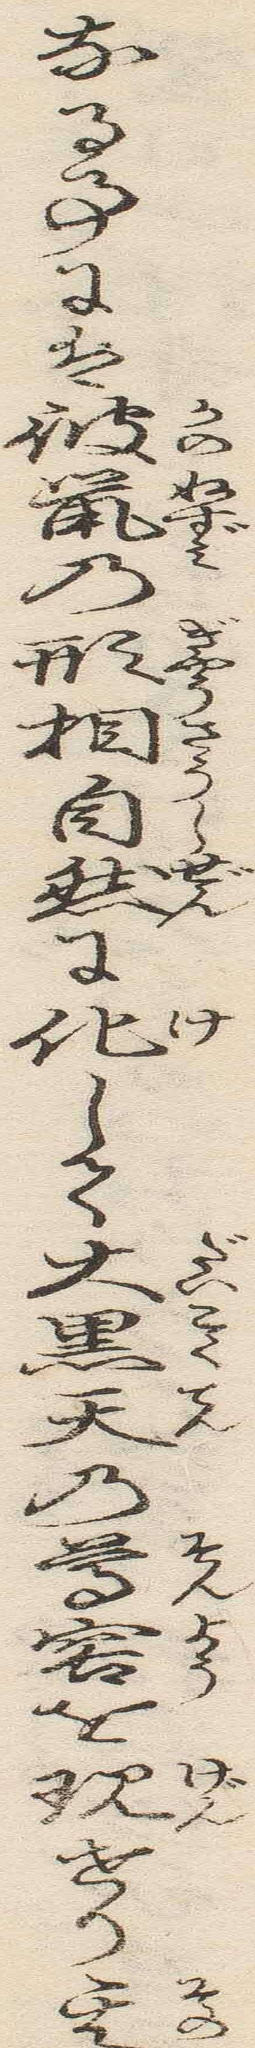なる事には彼鼠の形相自然に化して大黒天の尊容を現せり其
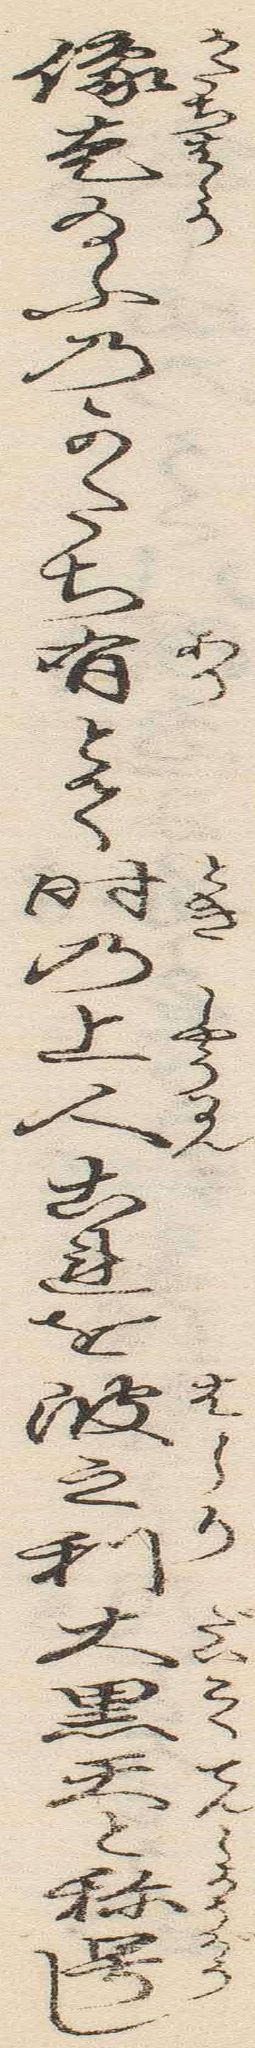像走給ふのかたち有とて时の上人これを波之利大黒天と称号し
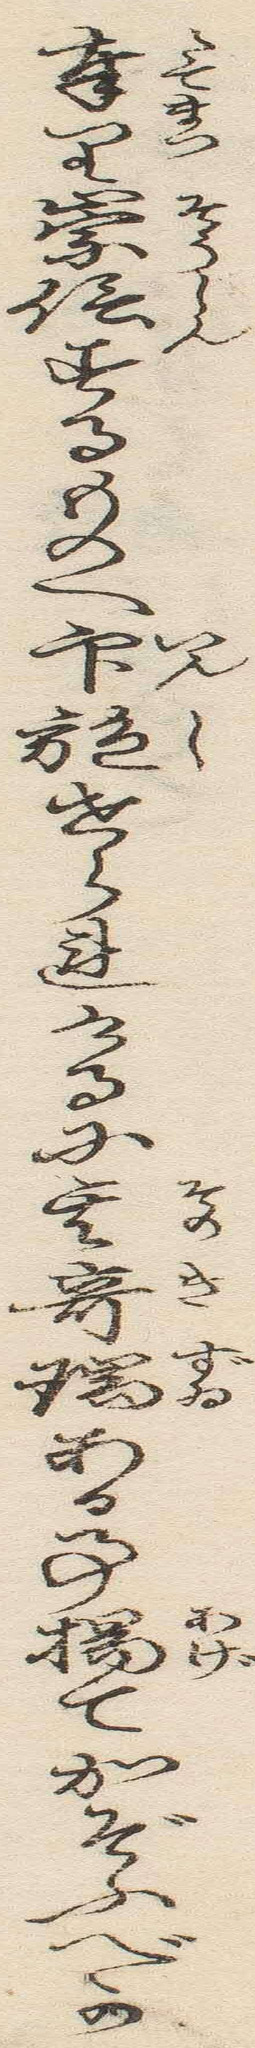奉り崇信するものへ印施せられけるに其竒瑞ある事揚てかぞふべか
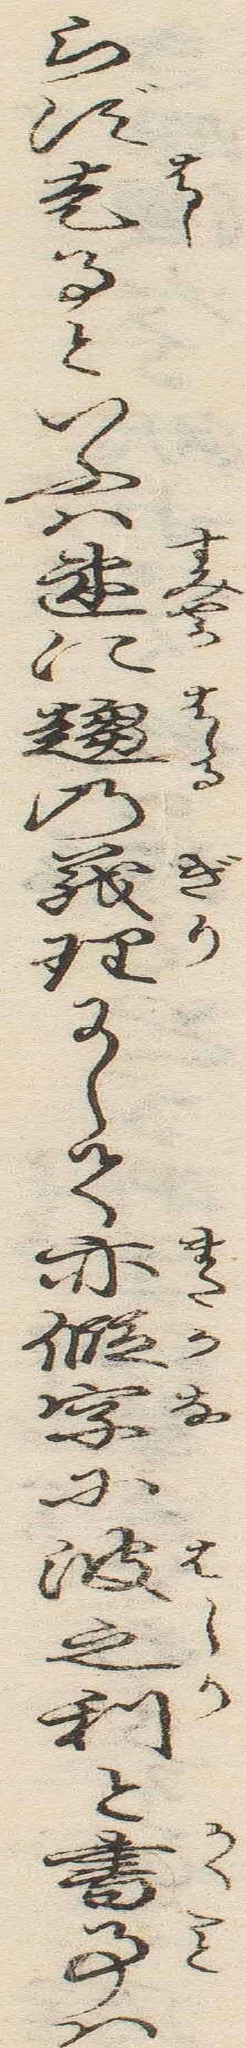らず走るといふは速に趨の義理にして亦假字に波之利と書事は
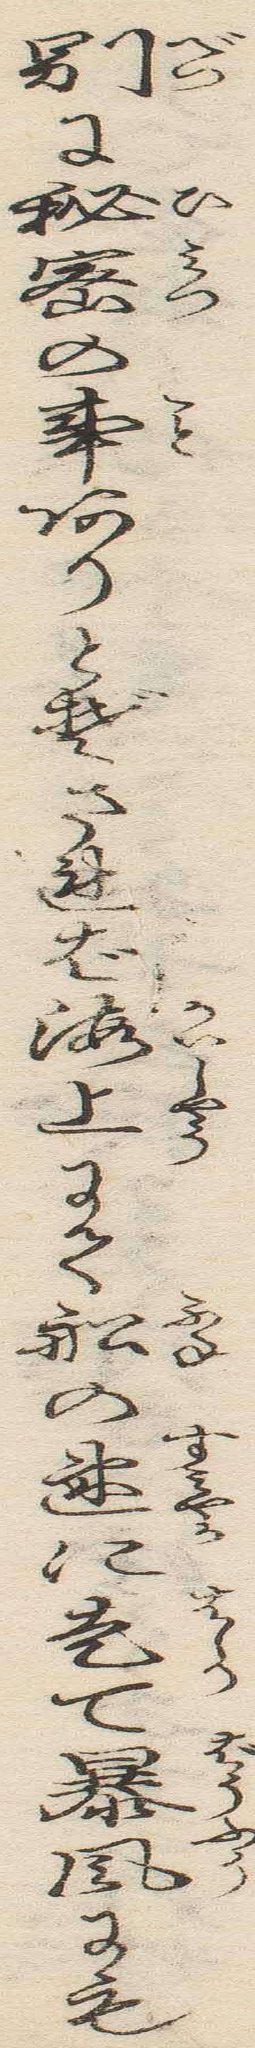別に秘密の事ありとぞされば海上にて舩の速に走て暴風にも
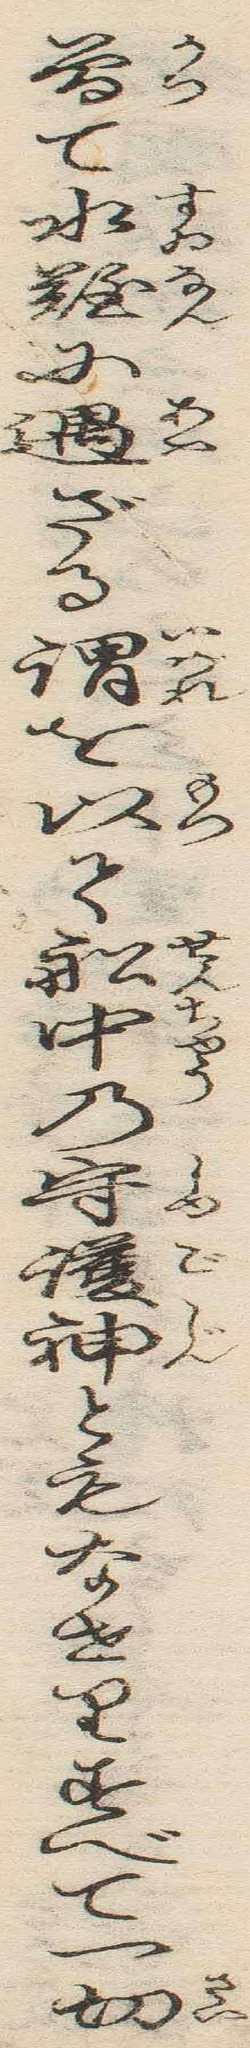曽て水難に遇ざる謂を以て舩中の守護神ともなせりすべて一切
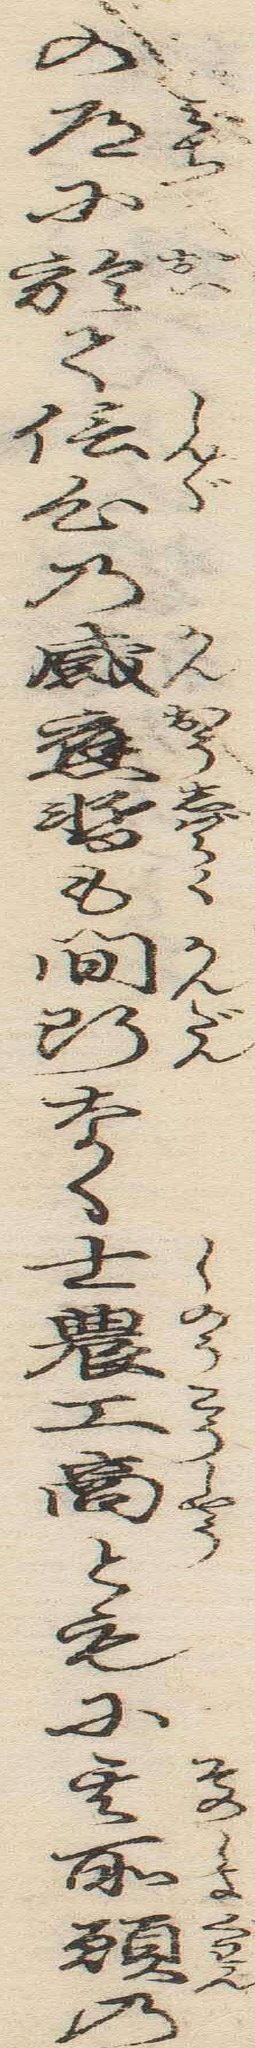の道に於て信心の感應暫も間断なく士農工商ともに其所願の
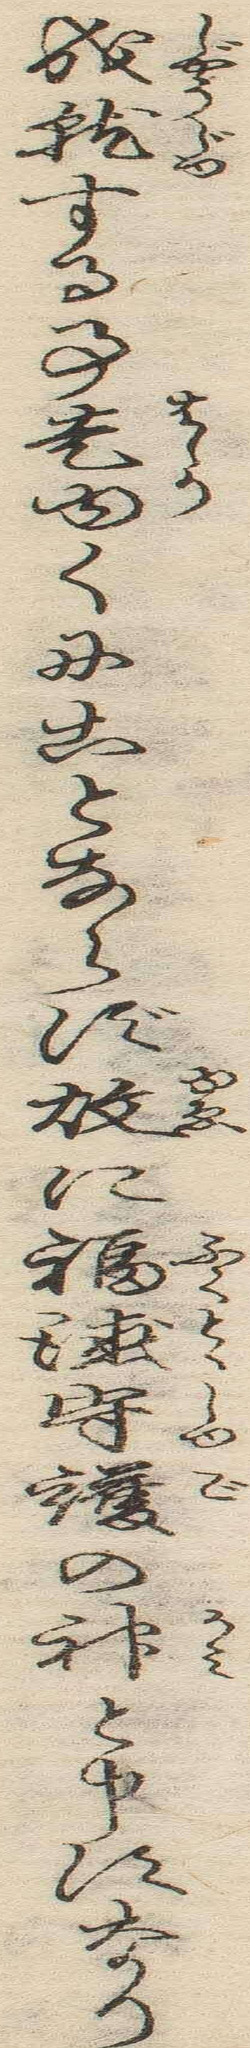成就する事走ゆくにことならず故に福徳守護の神と申すなり
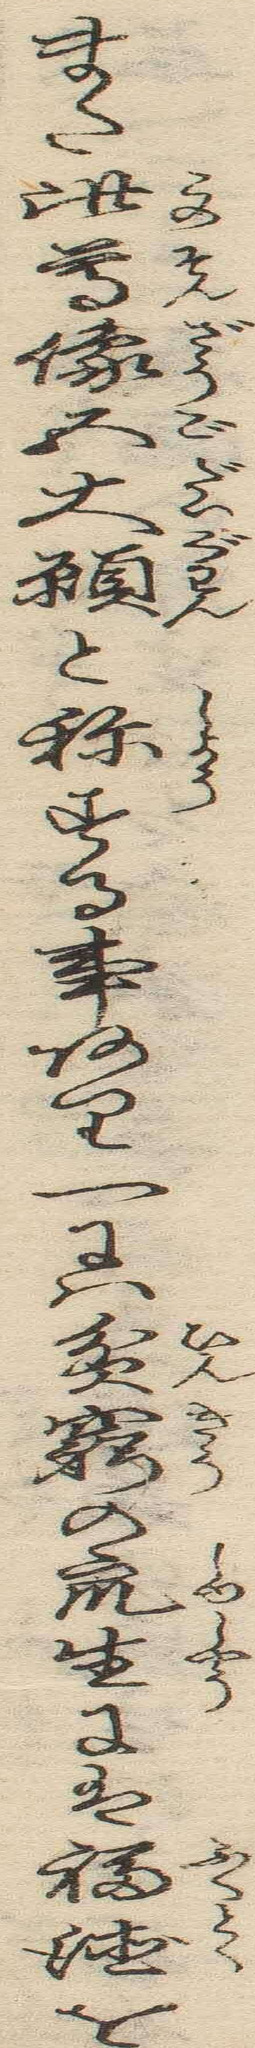また此尊像五大願と称する事あり一には貧窮の衆生には福徳を

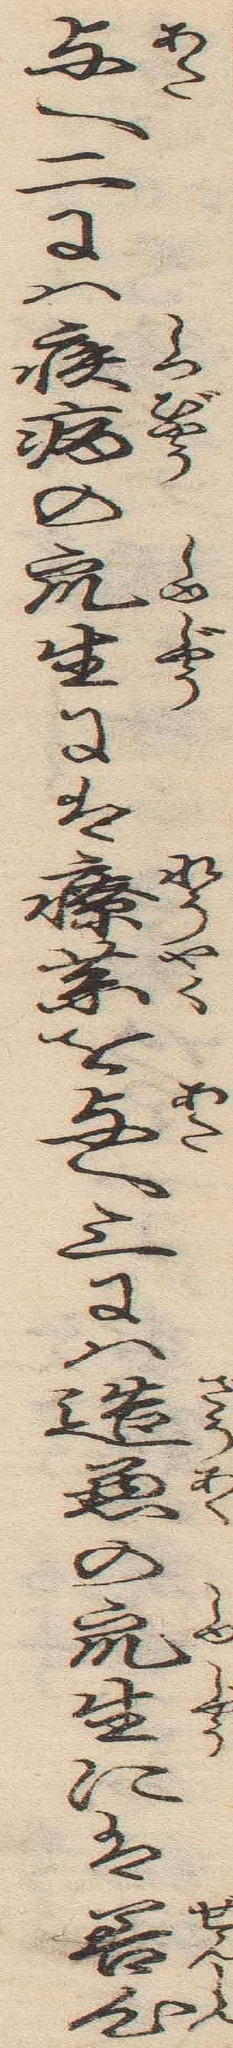与へ二には疾病の衆生には療薬を与へ三には造悪の衆生には善心
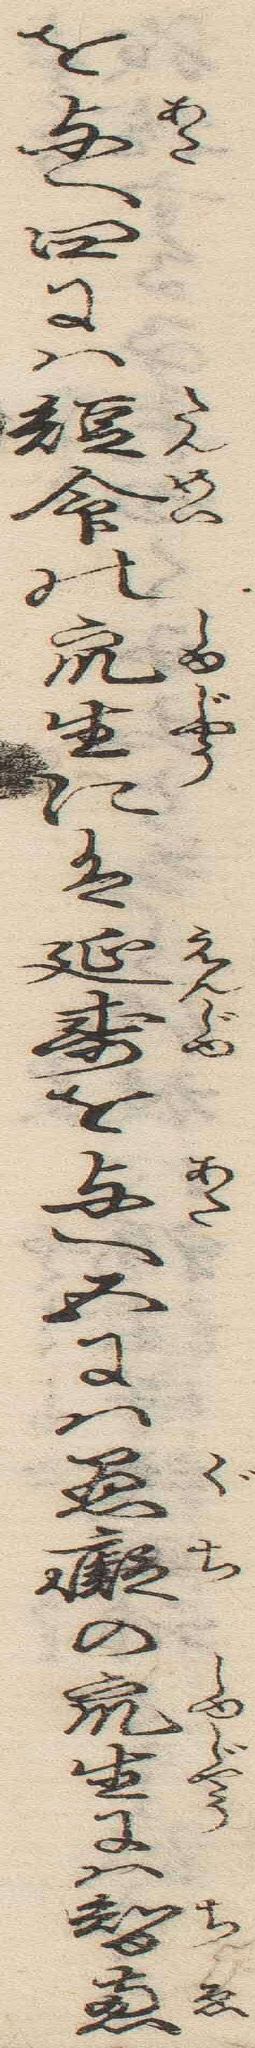を与へ四には短命の衆生には延寿を与へ五には愚癡の衆生には智恵
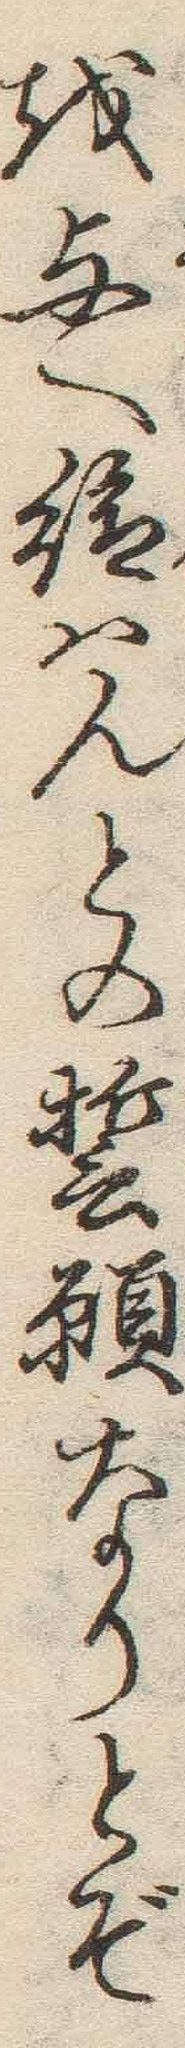を与へ給はんとの誓願なりとぞ
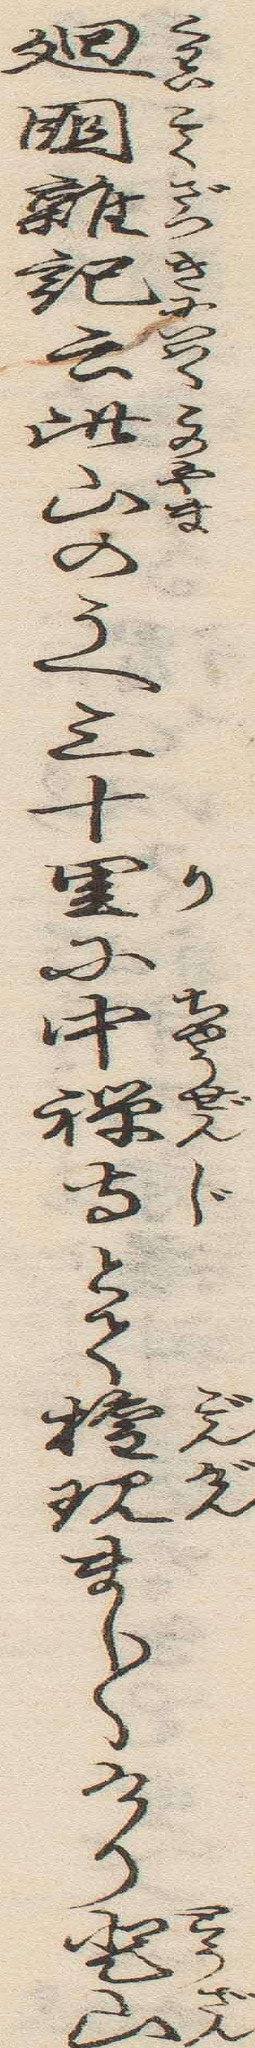𢌞國雜記云此山のうへ三十里に中禅寺とて權現まもけり登山
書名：日光山志
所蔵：東京学芸大学附属図書館 国文学研究資料館
